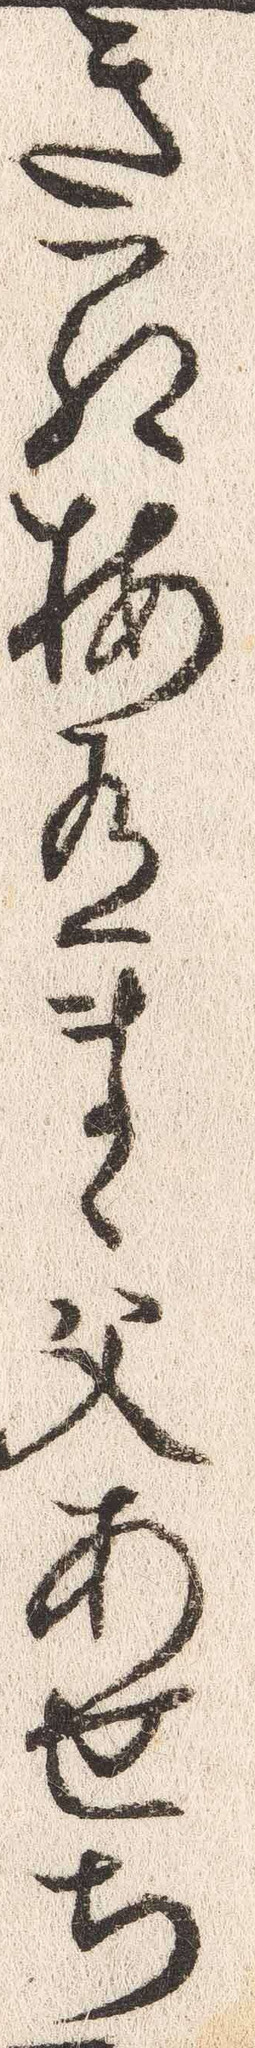き紅梅有まゝ父あせち
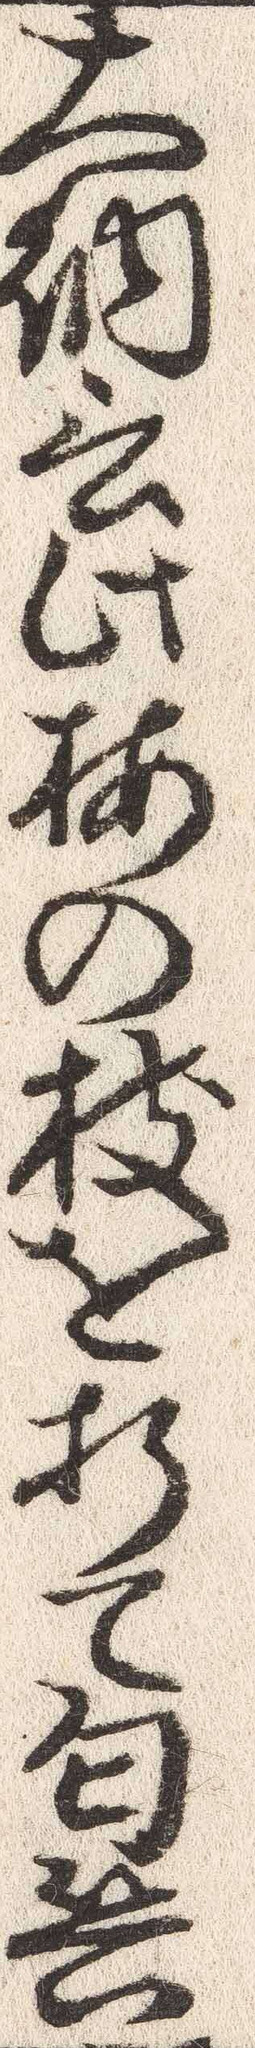大納言此梅の枝を折て匂兵
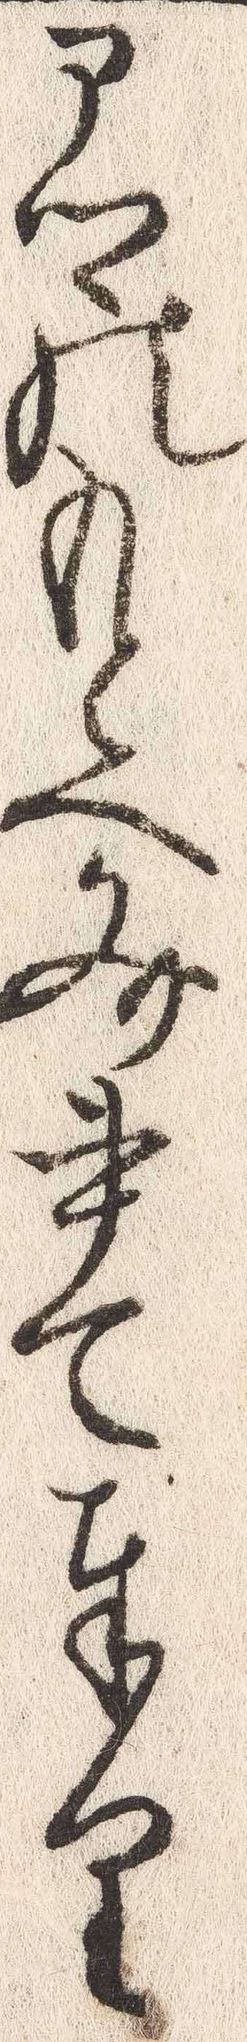部卿のもとへ文書て奉り
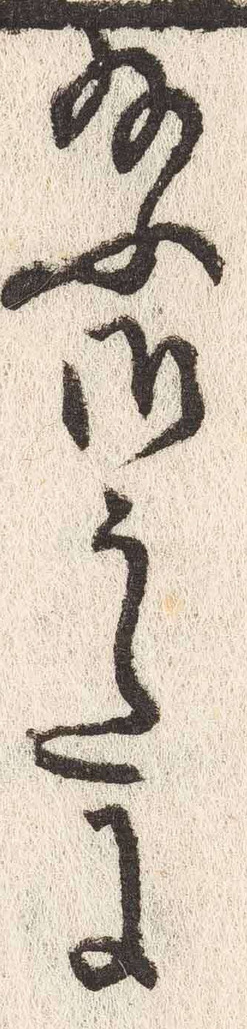給ふ御うたに
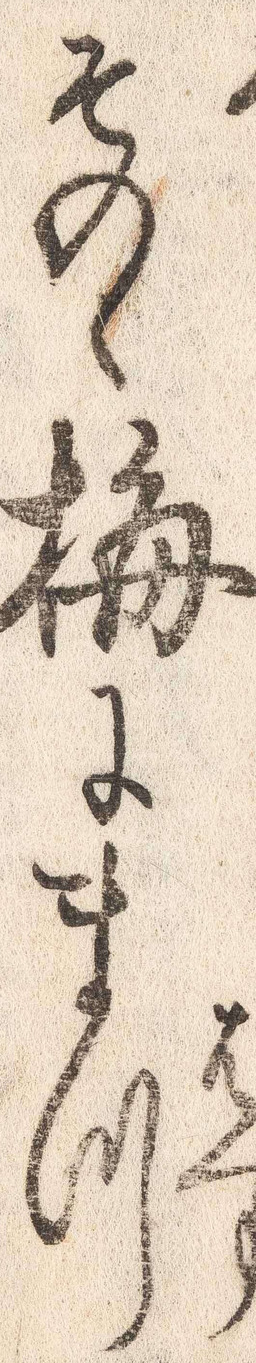そのゝ梅にまつ
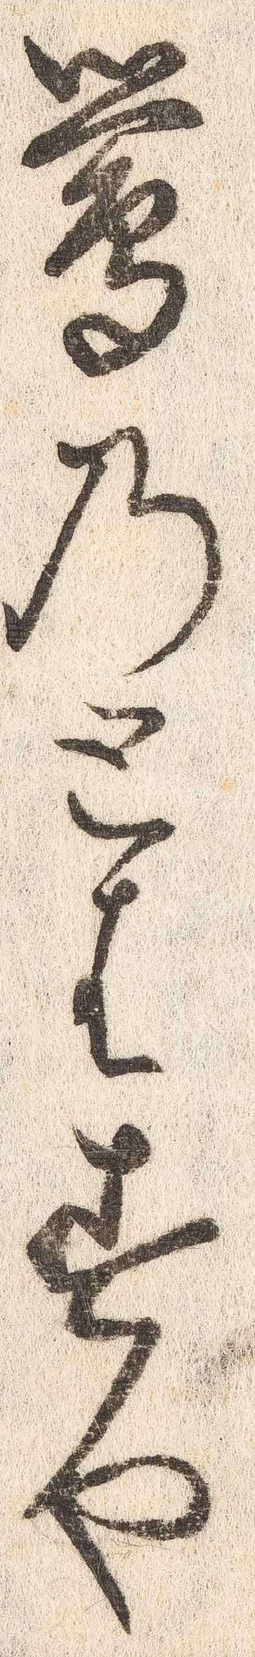鶯のとはすや
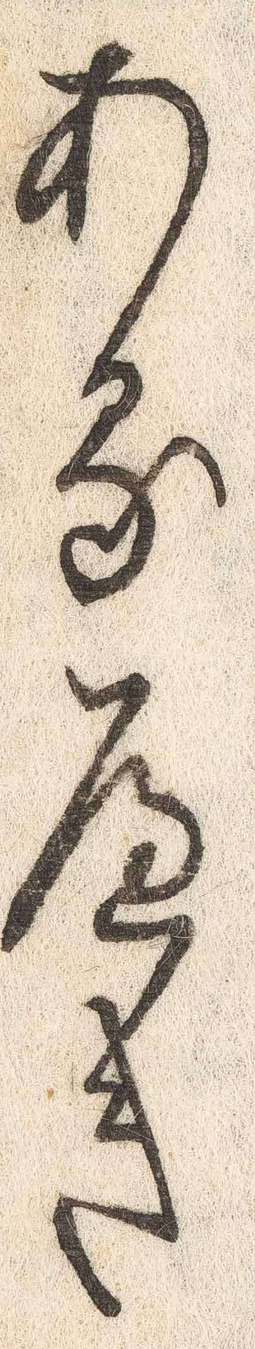あるへき

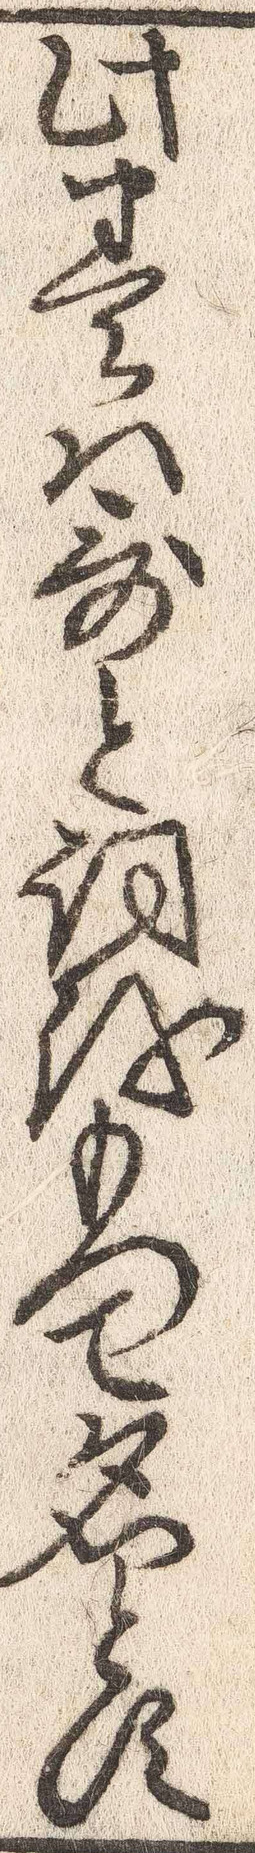此巻は哥と詞をもつて名とす
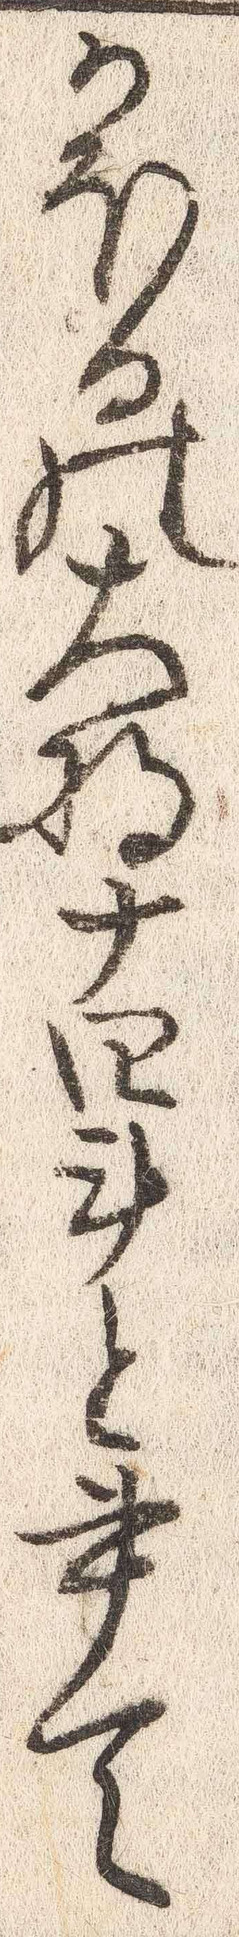かほるの大将十四計と書て
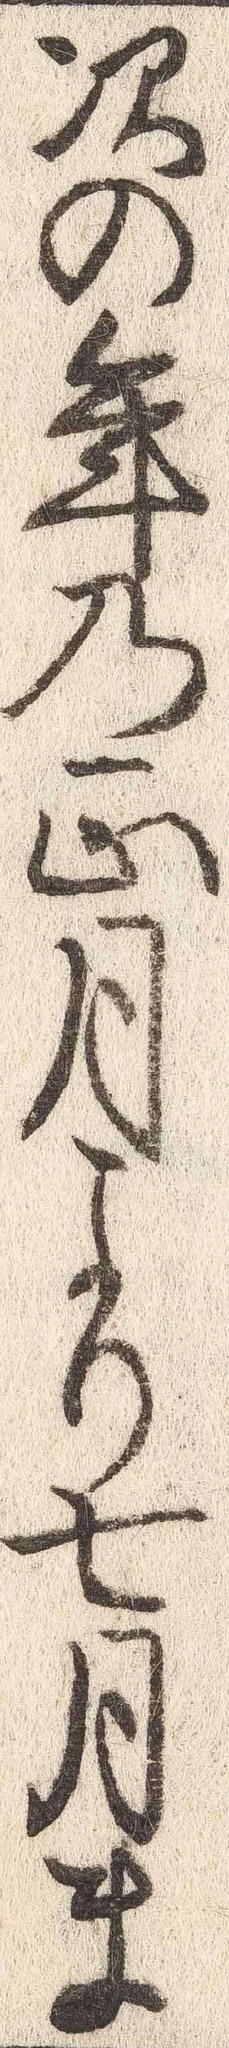次の年の正月より七月ま
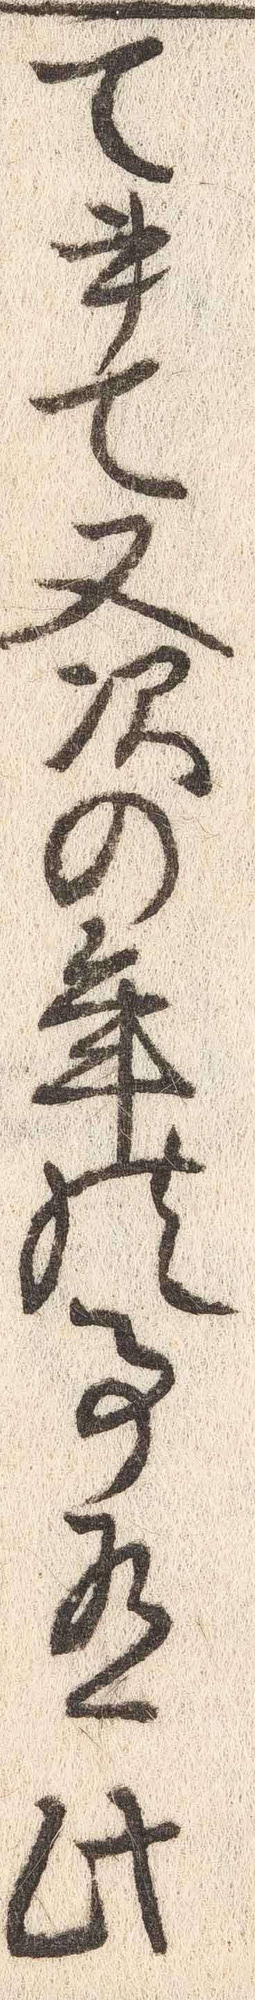て書て又次の年の事有此
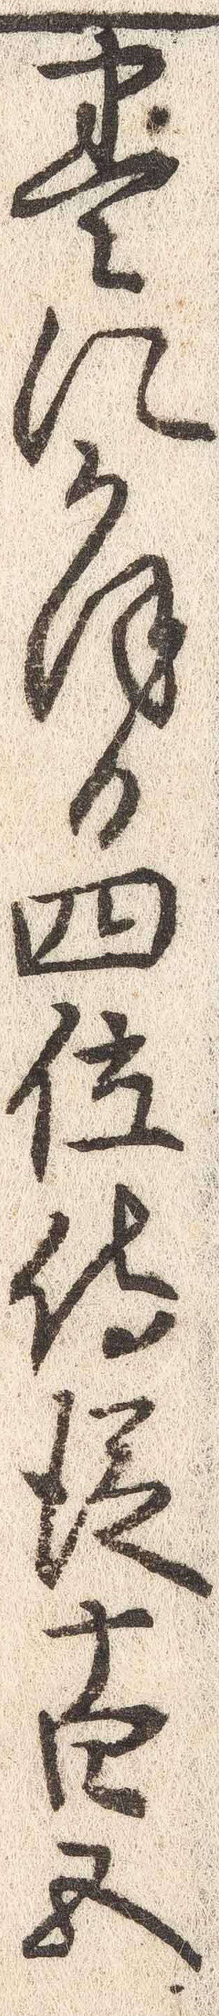巻にかほる四位侍従十四五
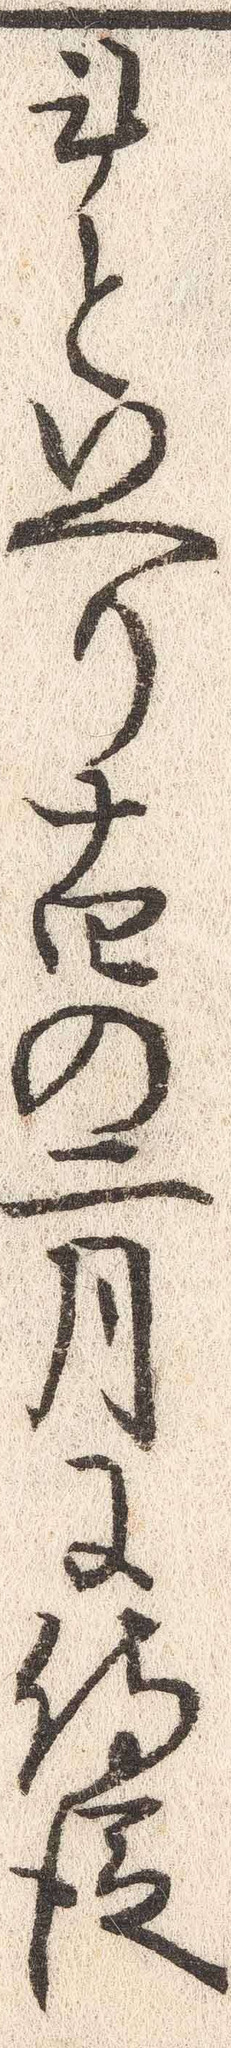計といへり十四の二月に侍従
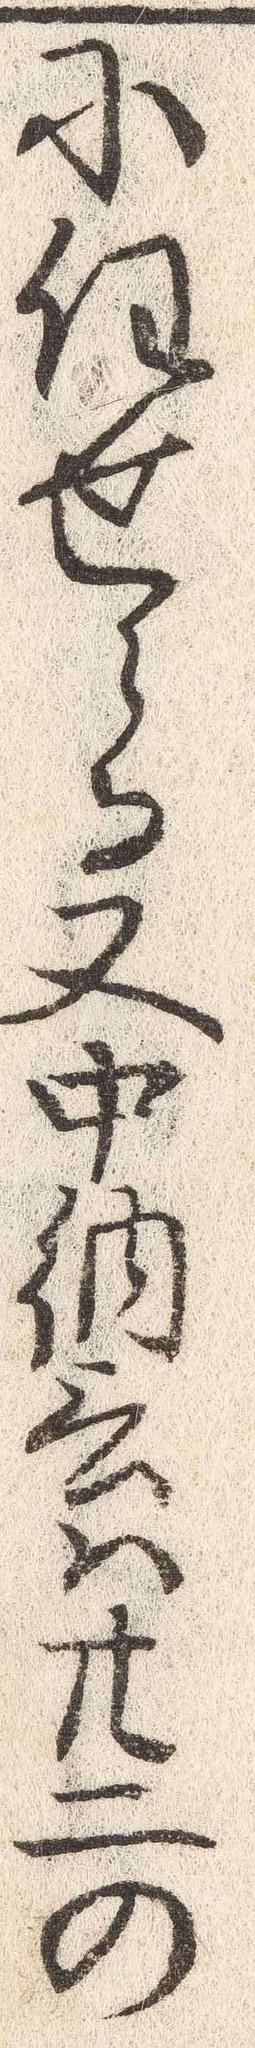に任せらる又中納言は廿二の
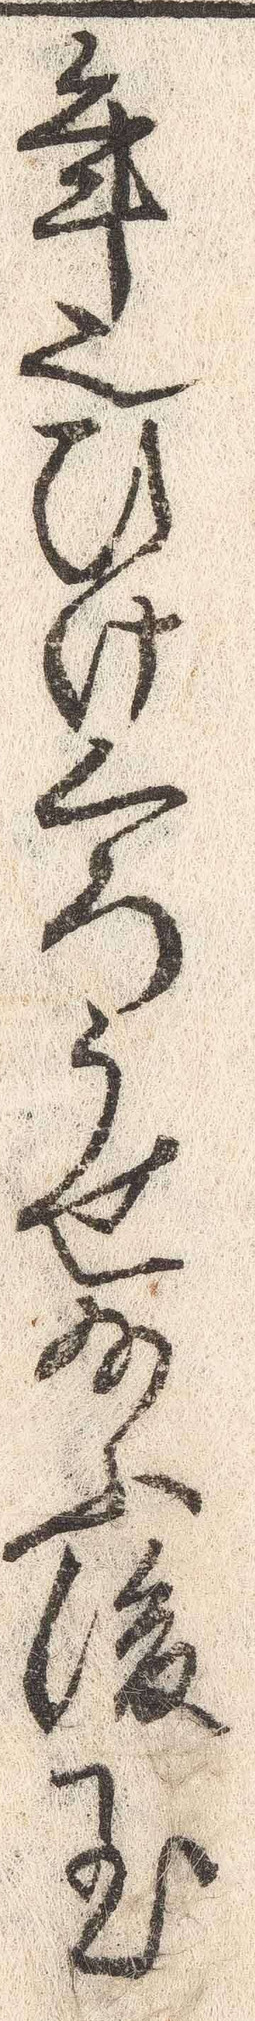年也ひけくろうせ給ふ後玉
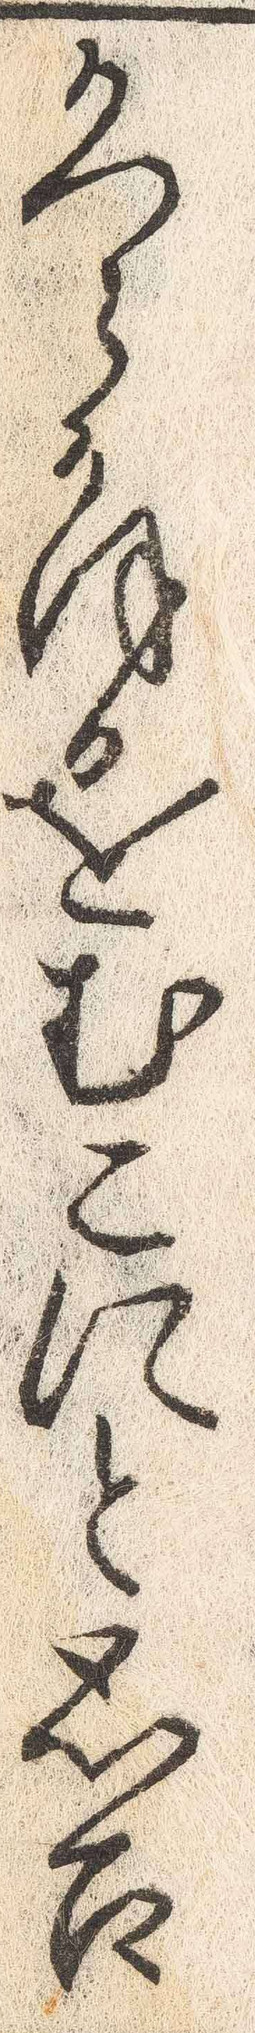かつらかほるをむこにと思召
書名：源氏物語
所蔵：東京学芸大学附属図書館 国文学研究資料館
